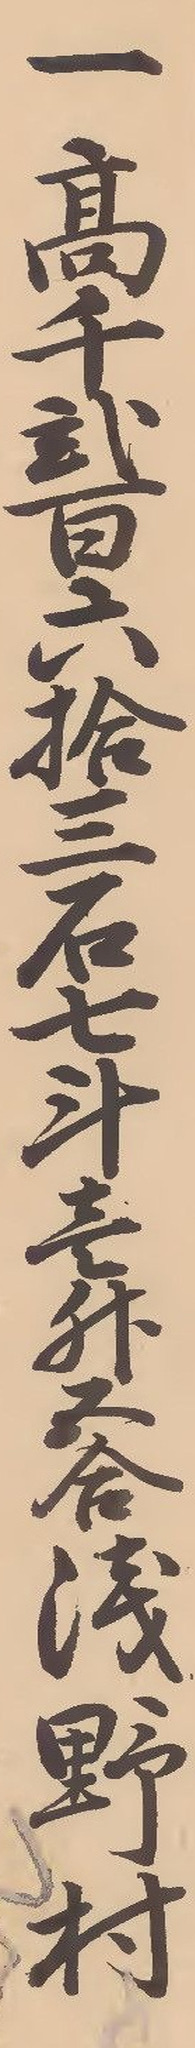一高千弐百六拾三石七斗壱升五合浅野村
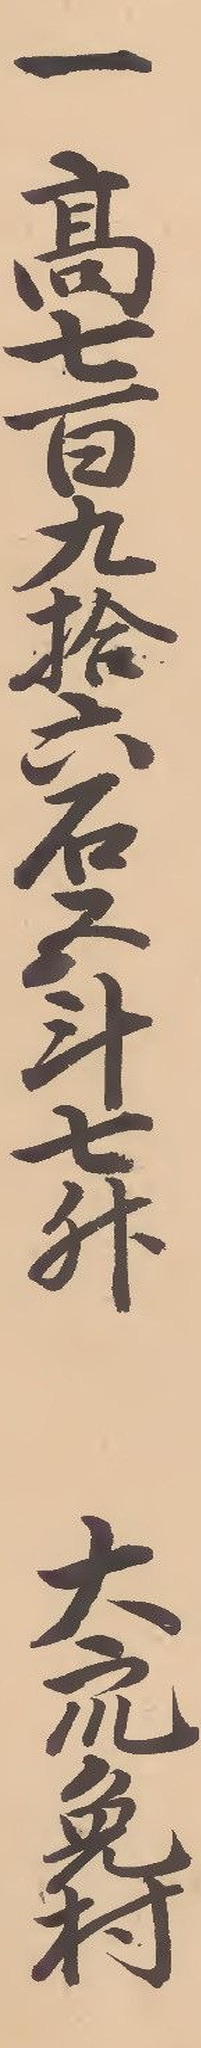一高七百九拾六石五斗七升大衆免村

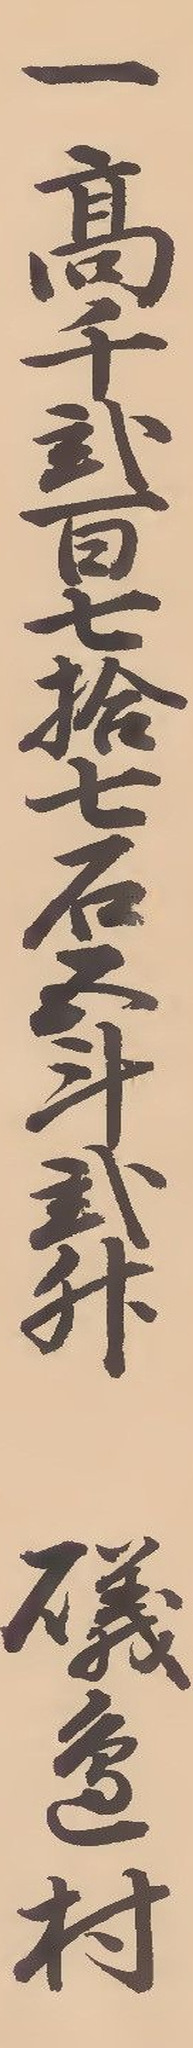一高千弐百七拾七石五斗弐升礒辺村
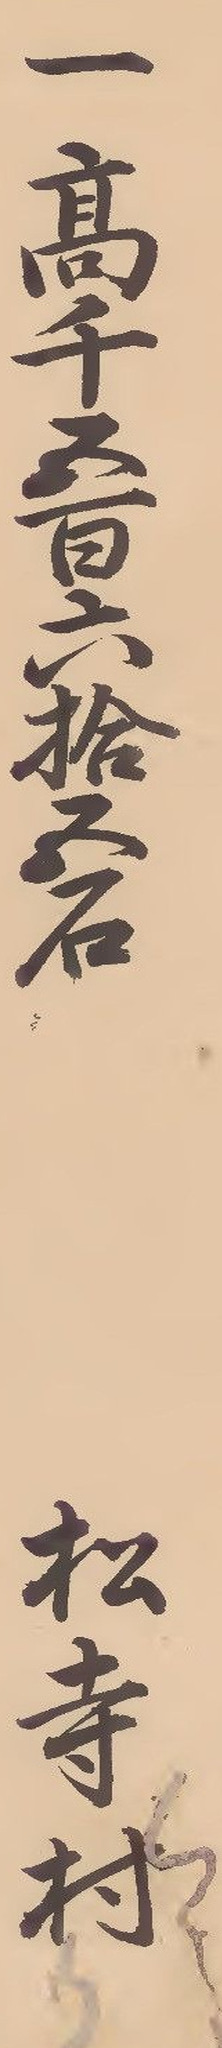一高千五百六拾五石松寺村
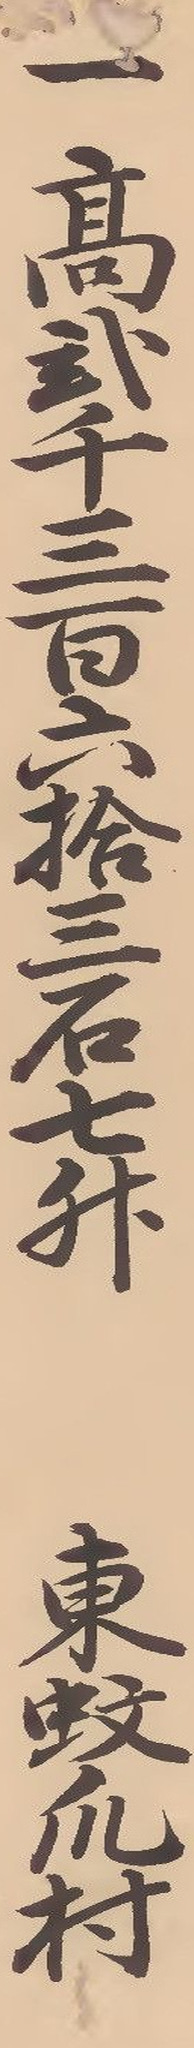一高弐千三百六拾三石七升東蚊爪村
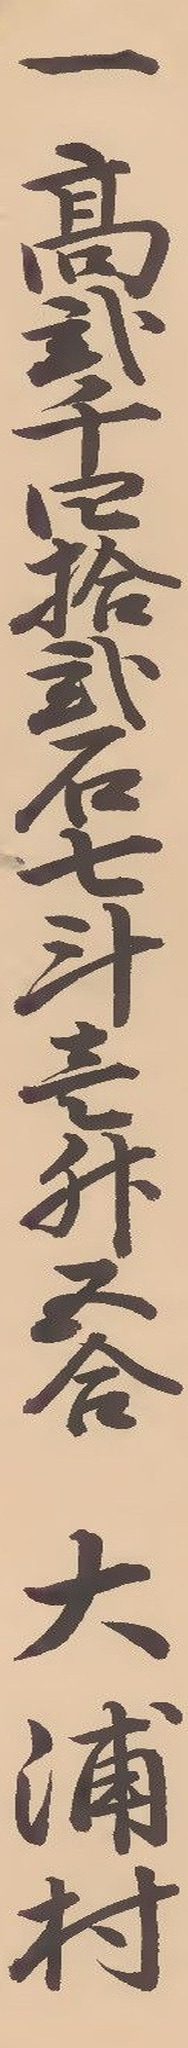一高弐千四拾弐石七斗壱升五合大浦村
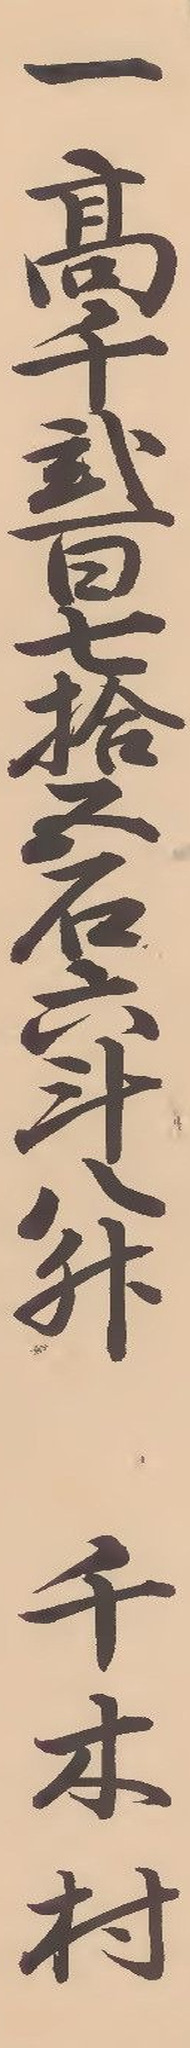一高千弐百七拾五石六斗八升千木村

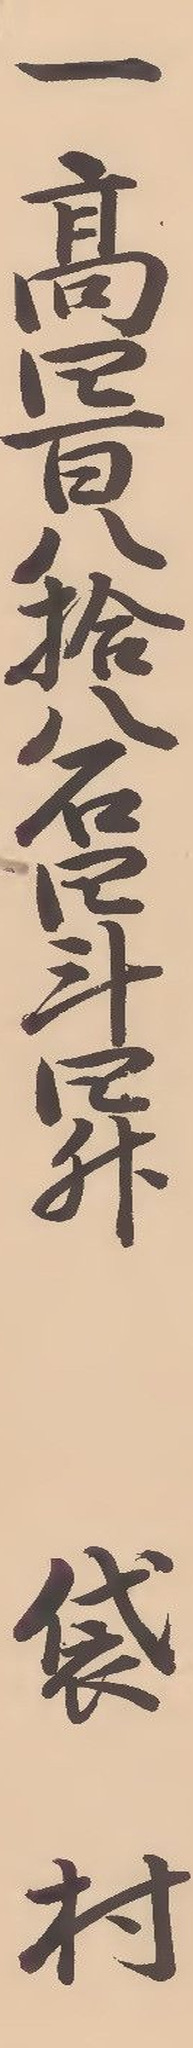一高四百八拾八石四斗四升袋村
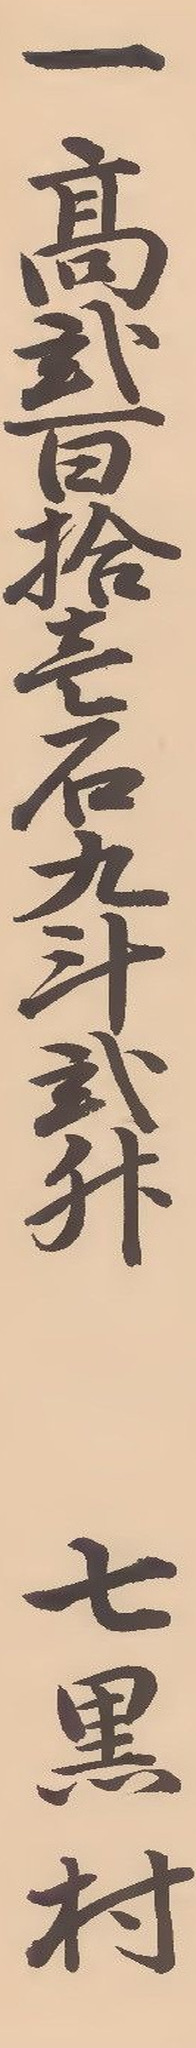一高弐百拾壱石九斗弐升七黒村

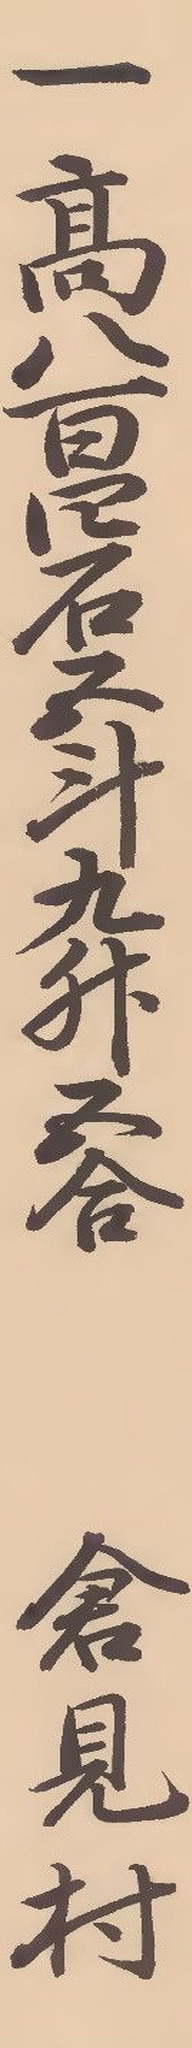一高八百四石五斗九升五合倉見村
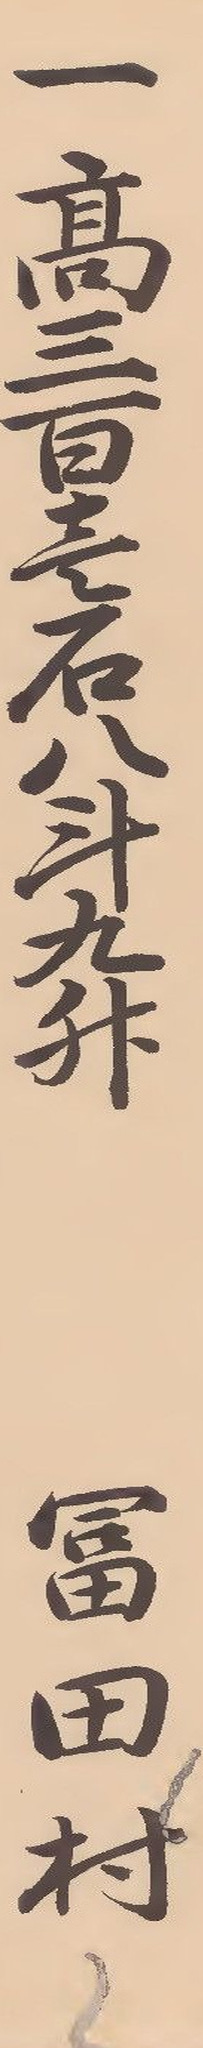一高三百壱石八斗九升富田村
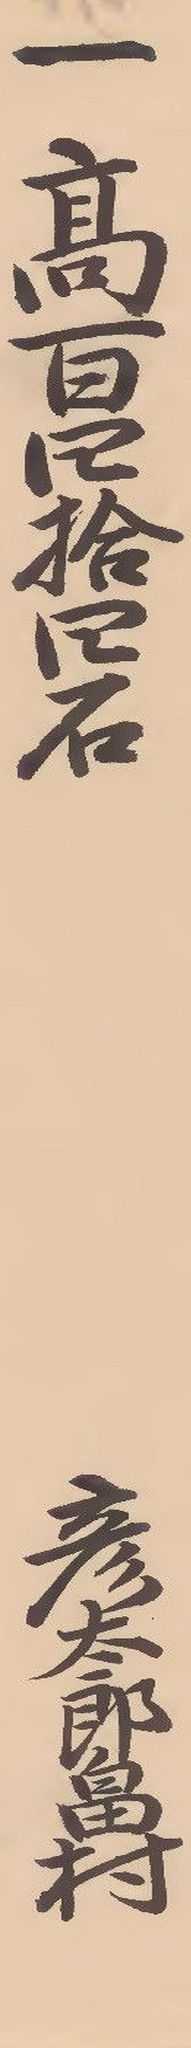一高百四拾四石彦太郎畠村
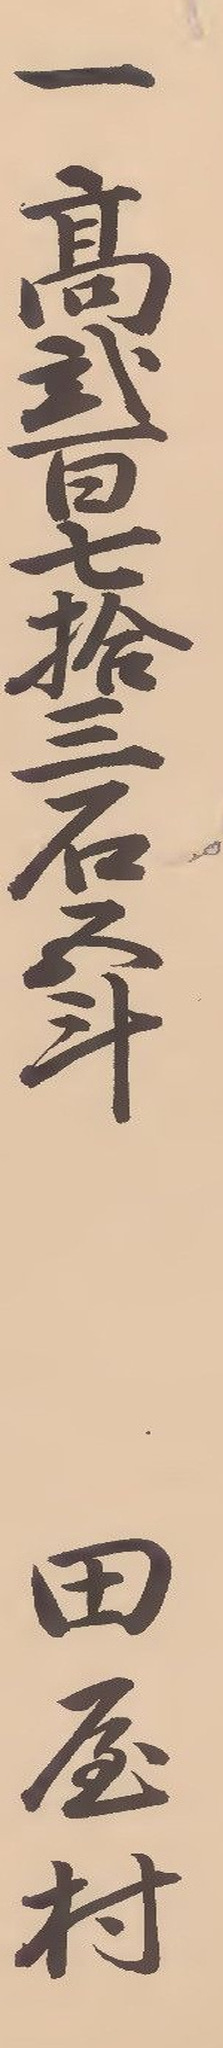一高弐百七拾三石五斗田屋村
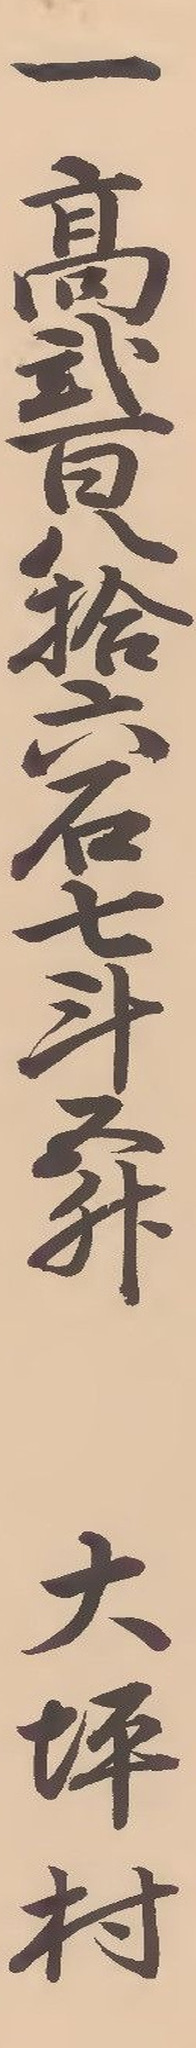一高弐百八拾六石七斗五升大坪村
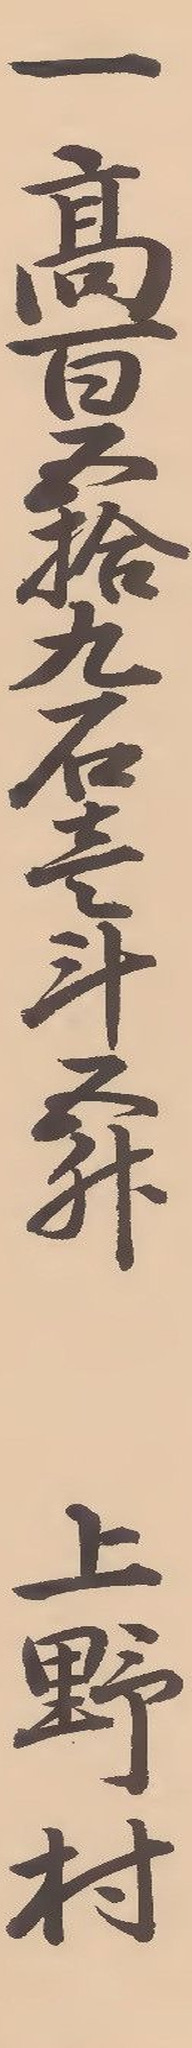一高百五拾九石壱斗五升上野村

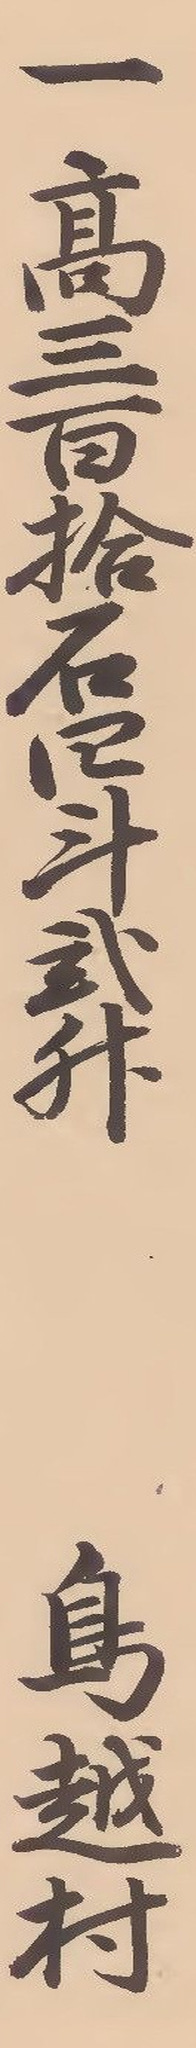一高三百拾石四斗弐升鳥越村
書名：加賀国郷帳
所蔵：国立公文書館 National Archives of Japan
